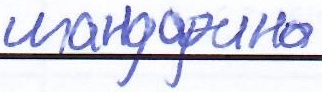мандарина
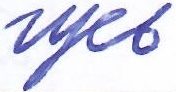гусь
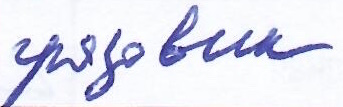грязовик
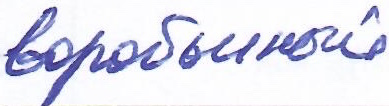воробьиный
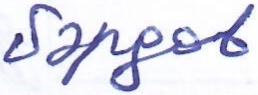бэрдов
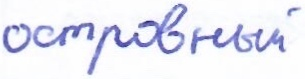островный
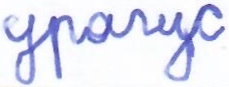урагус
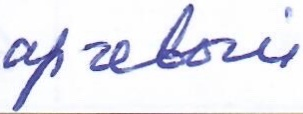арчевый
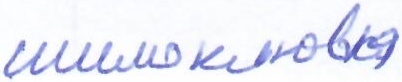шилоклювка
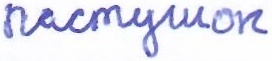пастушок
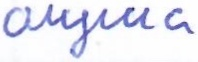олуша
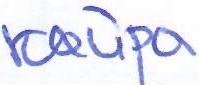кайра
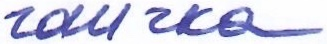гаичка
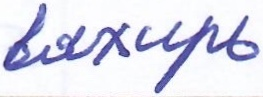вяхирь
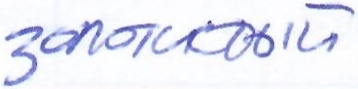золотистый
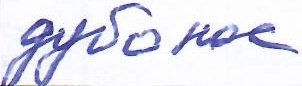дубонос
